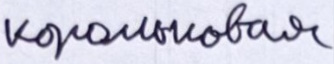корольковая
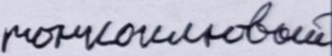тонкоклювый
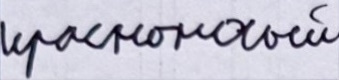красноносый
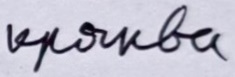кряква
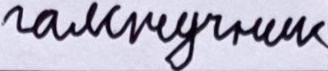галстучник
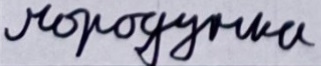мородунка
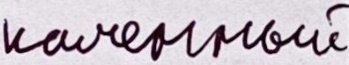каменный
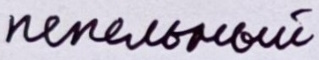пепельный
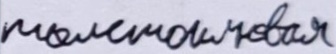толстоклювая
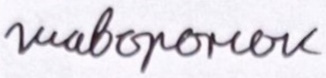жаворонок
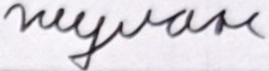жулан
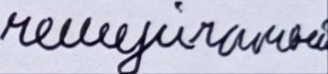чешуйчатый
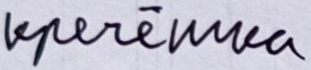кречётка
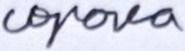сорока
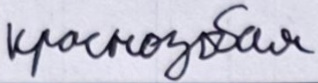краснозобая
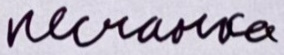песчанка
